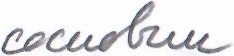сосновик
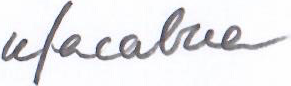красавка
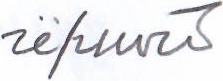чёрный
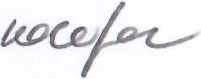носорог
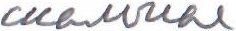скальная
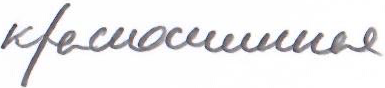красноспинная
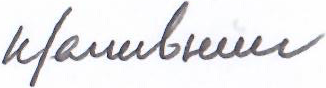крапивник
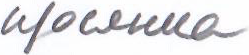просянка
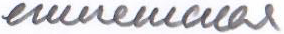египетская
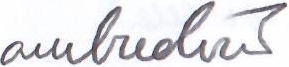оливковый
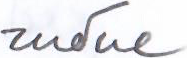чибис
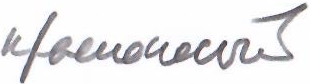красноносый
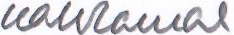кольчатая
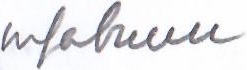травник
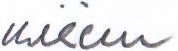клёст
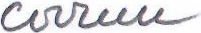сычик
